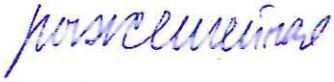рыжешейная
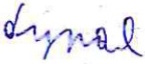бупая
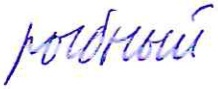рыбный
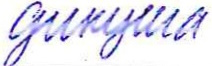дикуша
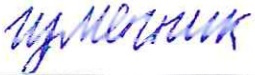гуменник
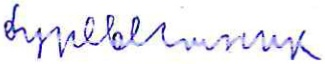буревестник
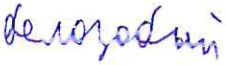белозобый
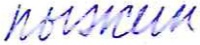пыжик
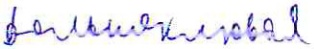большеклювая
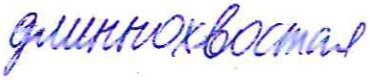длиннохвостая
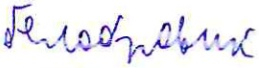белобровик
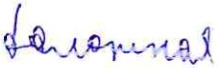болотная
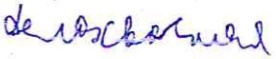белохвостая
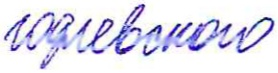годлевского
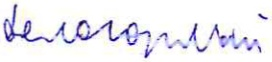белогорлый
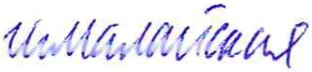гималайская
